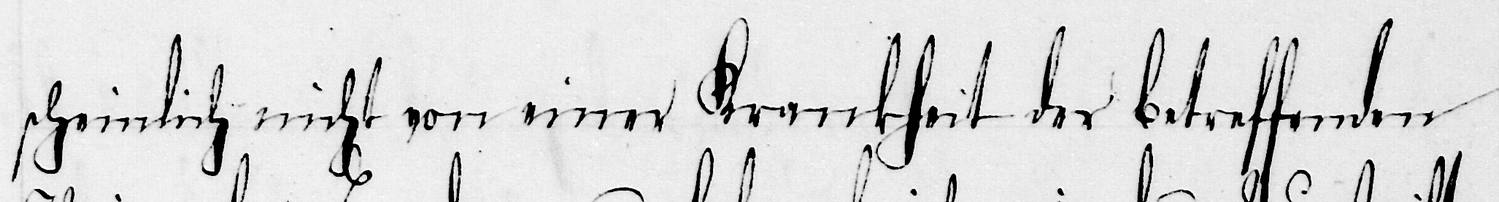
cheinlich nicht von einer Krankheit der betreffenden
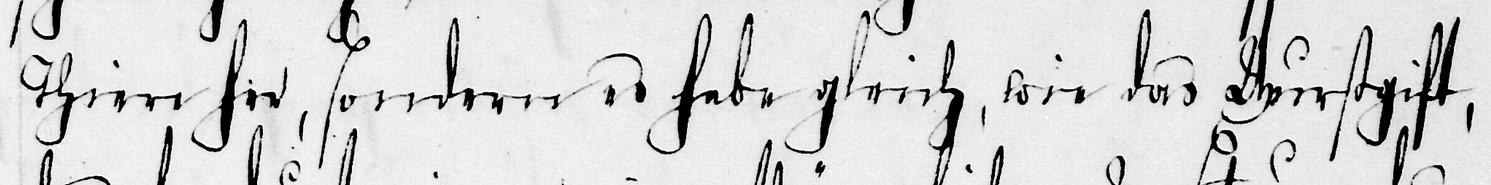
Thiere her, sondern es habe gleich, wie das Wurstgift,
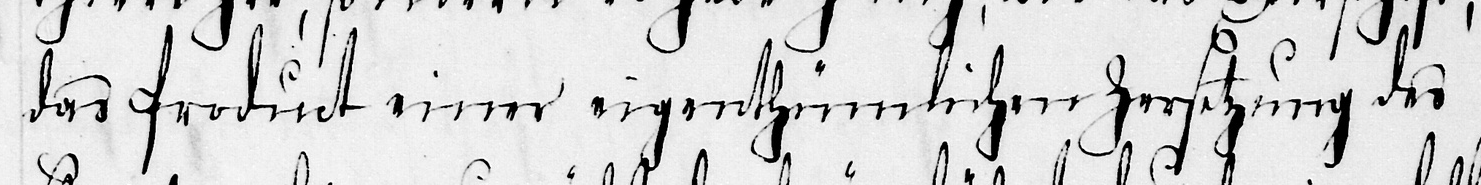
das Product einer eigenthümlichen Zersetzung des
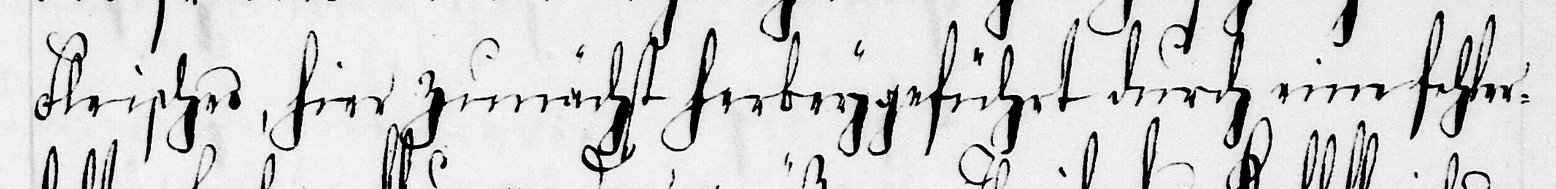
Fleisches, hier zunächst herbeygeführt durch eine fehle¬
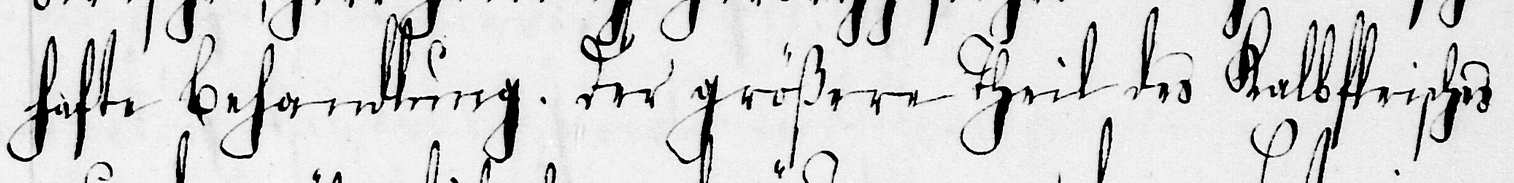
hafte Behandlung. Der größere Theil des Kalbfleisches
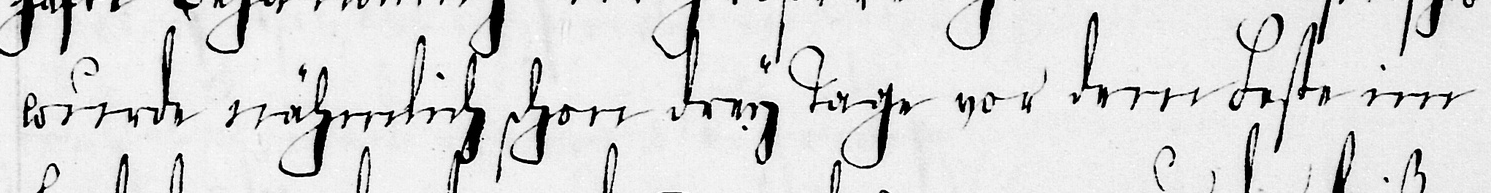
wurde nähmlich schon drey Tage vor dem Feste im
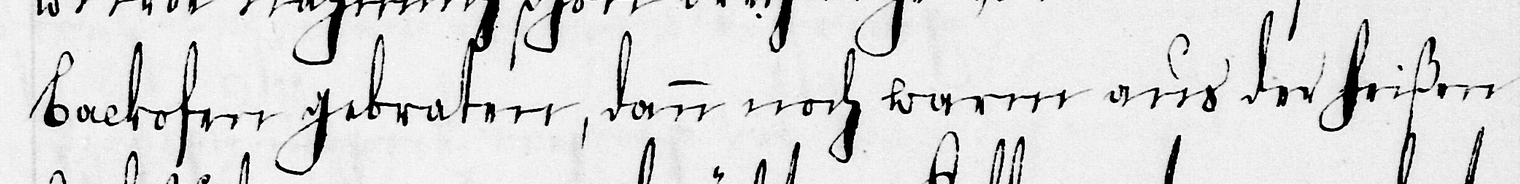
Backofen gebraten, dann noch warm aus der heißen
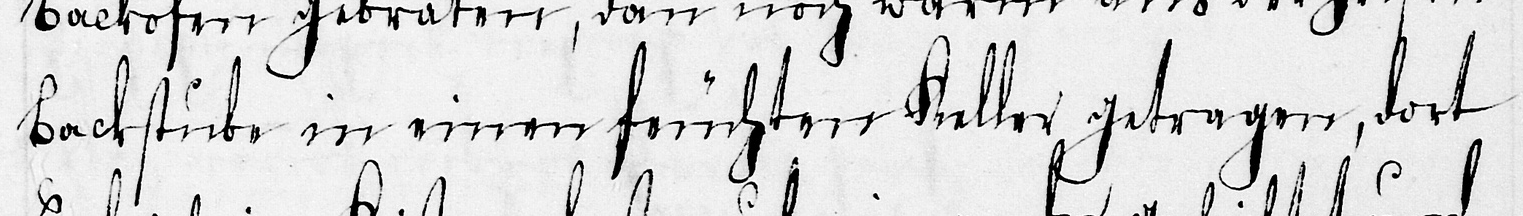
Backstube in einen feuchten Keller getragen, dort
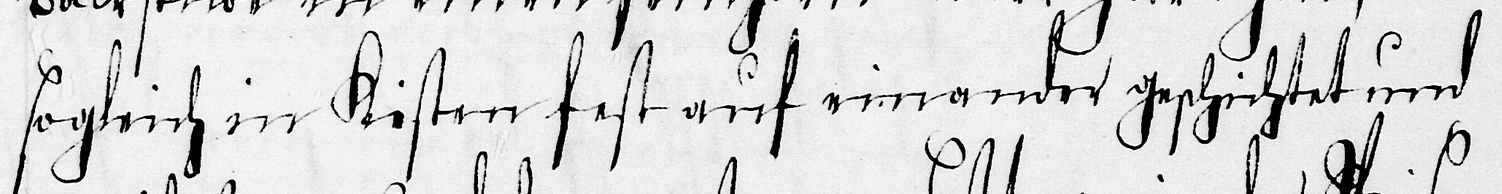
sogleich in Kisten fest auf einander geschichtet und
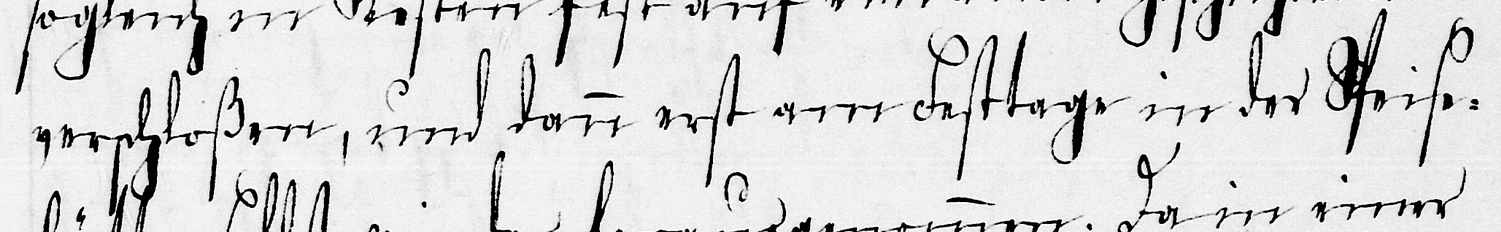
verschloßen, und dann erst am Festtage in der Speis¬
